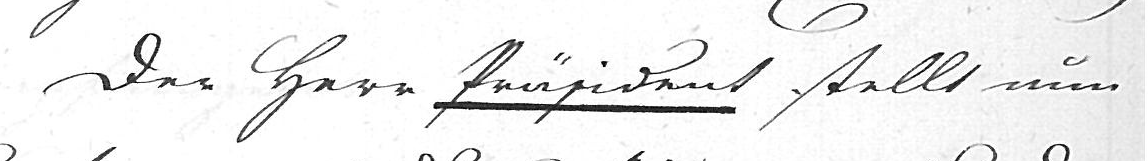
Der Herr Präsident stellt nun
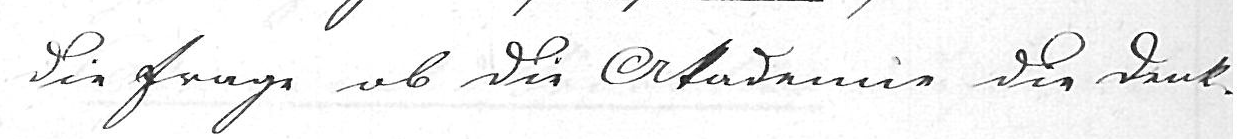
die Frage ob die Akademie die Denk-
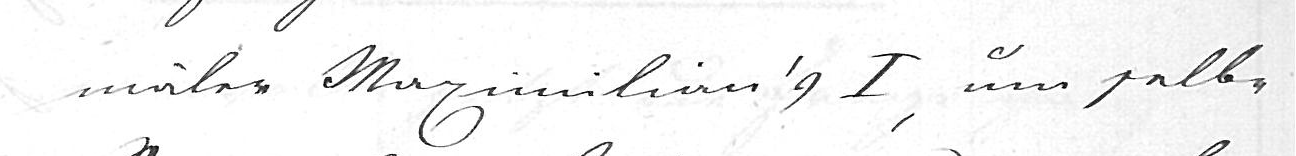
mäler Maximilian's I, um selbe
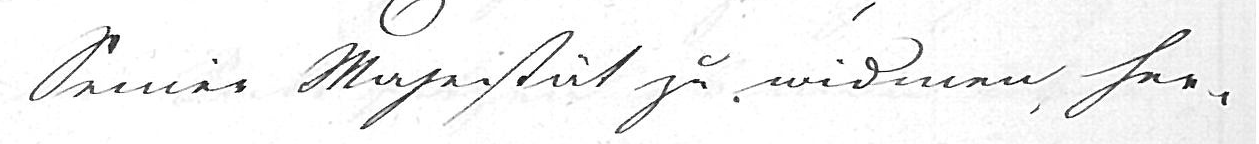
Seiner Majestät zu widmen her-
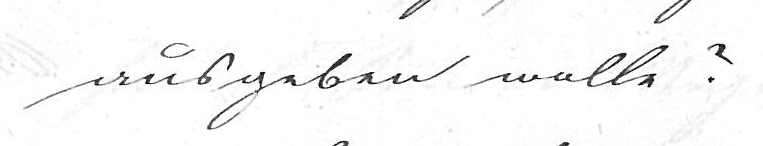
ausgeben wolle?
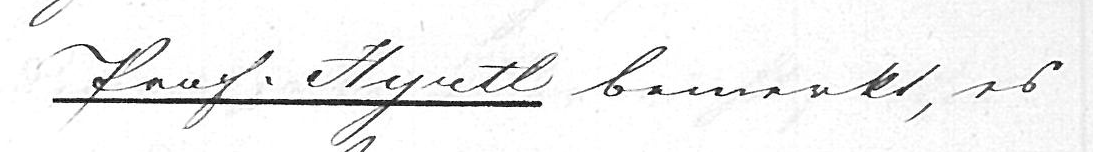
Prof. Hyrtl bemerkt, es
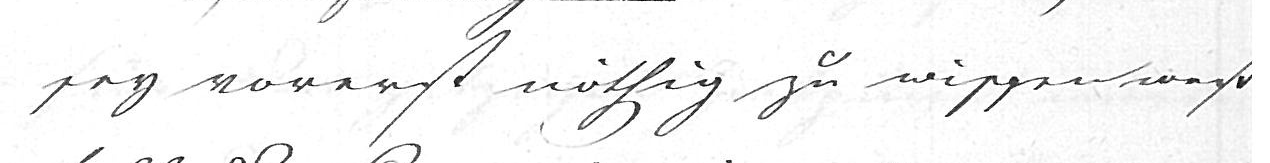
sey vorerst nöthig zu wissen wes-
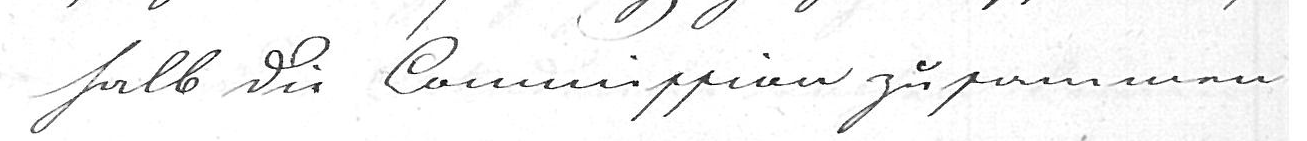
halb die Commission zusammen
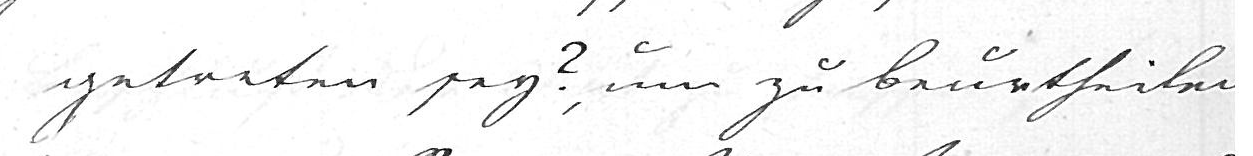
getreten sey?, um zu beurtheilen
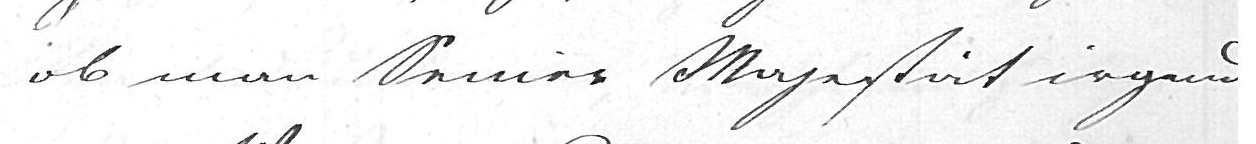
ob man Seiner Majestät irgend
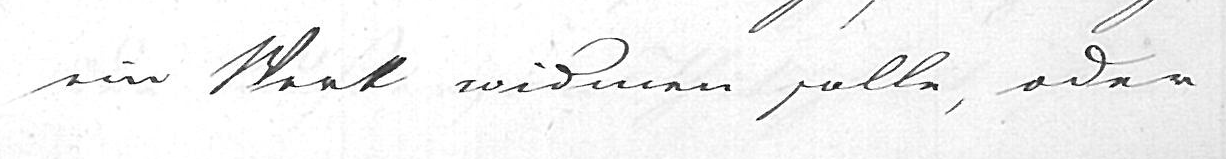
ein Werk widmen solle, oder
